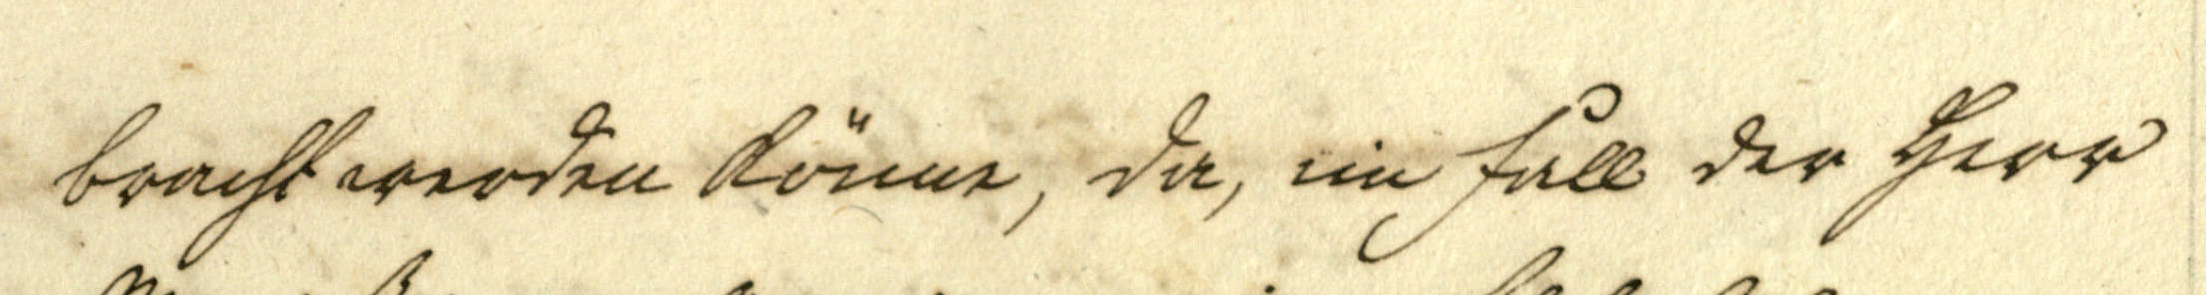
bracht werden könne, da, im Fall der Herr
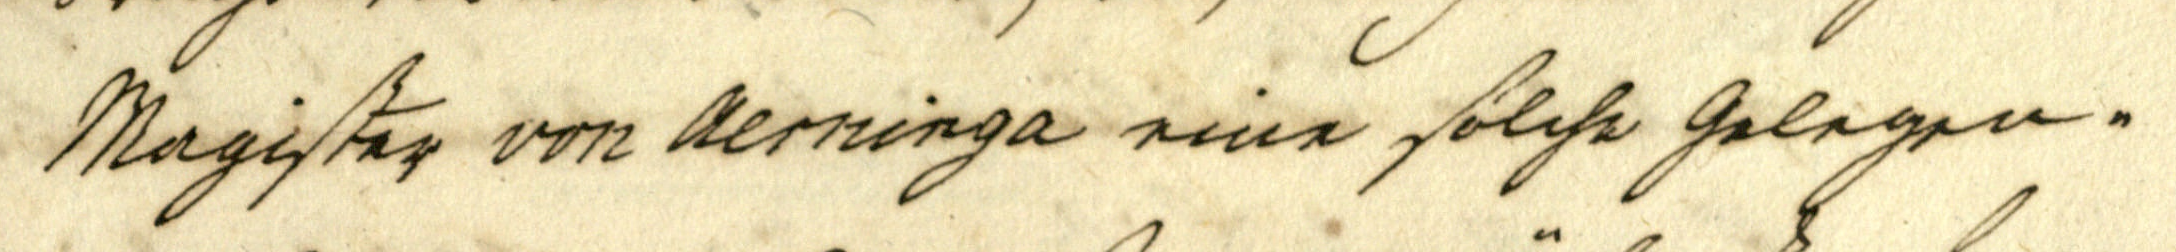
Magister von Aeminga eine solche Gelegen¬
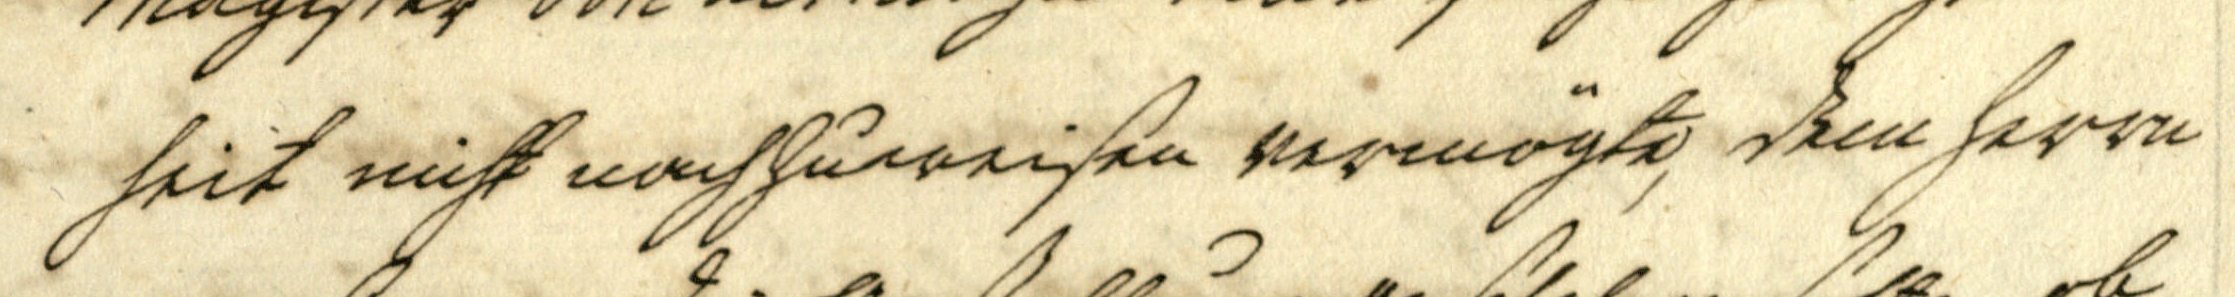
heit nicht nachzuweisen vermögte, dem Herrn
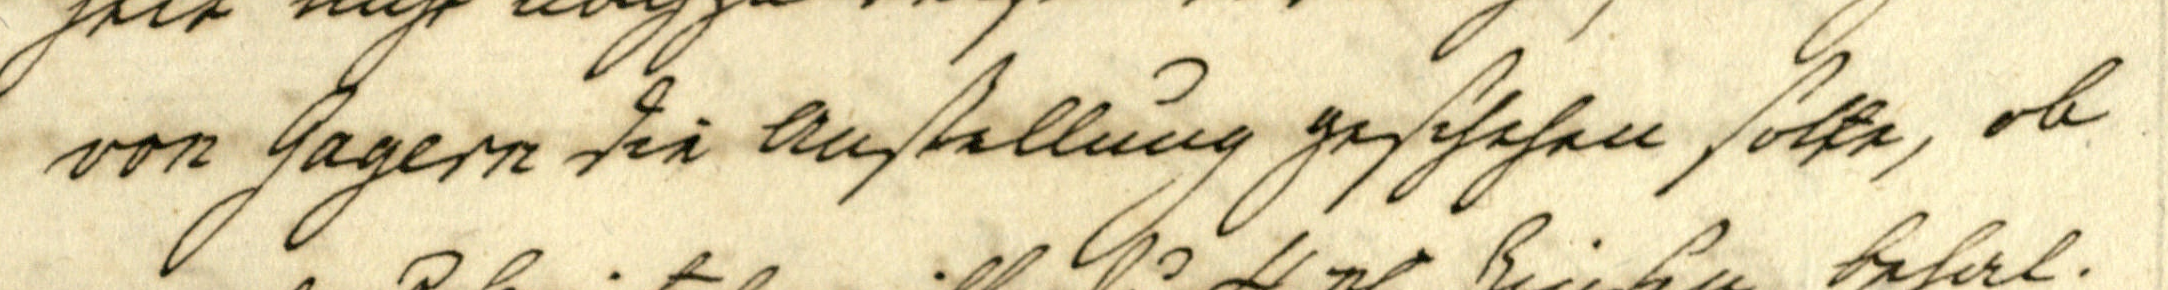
von Gagern die Anstellung geschehen solte, ob
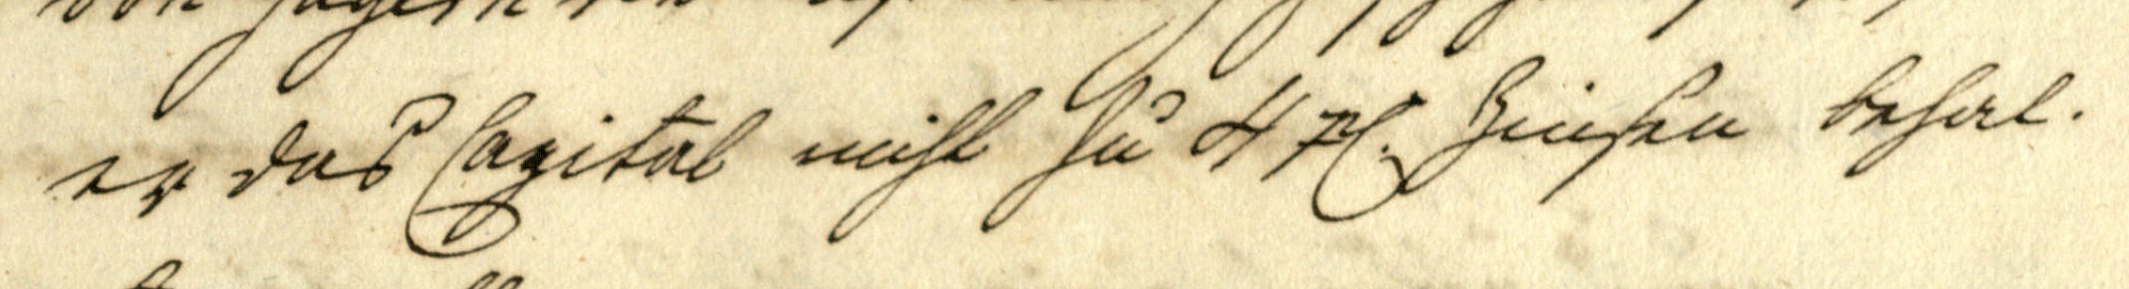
er das Capital nicht zu 4 pl. Zinsen behal¬
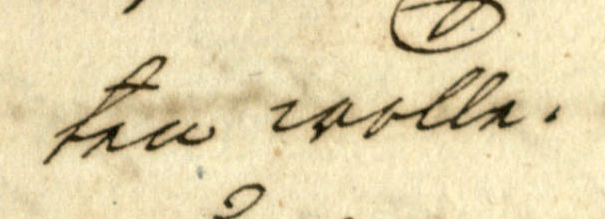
ten wolle.
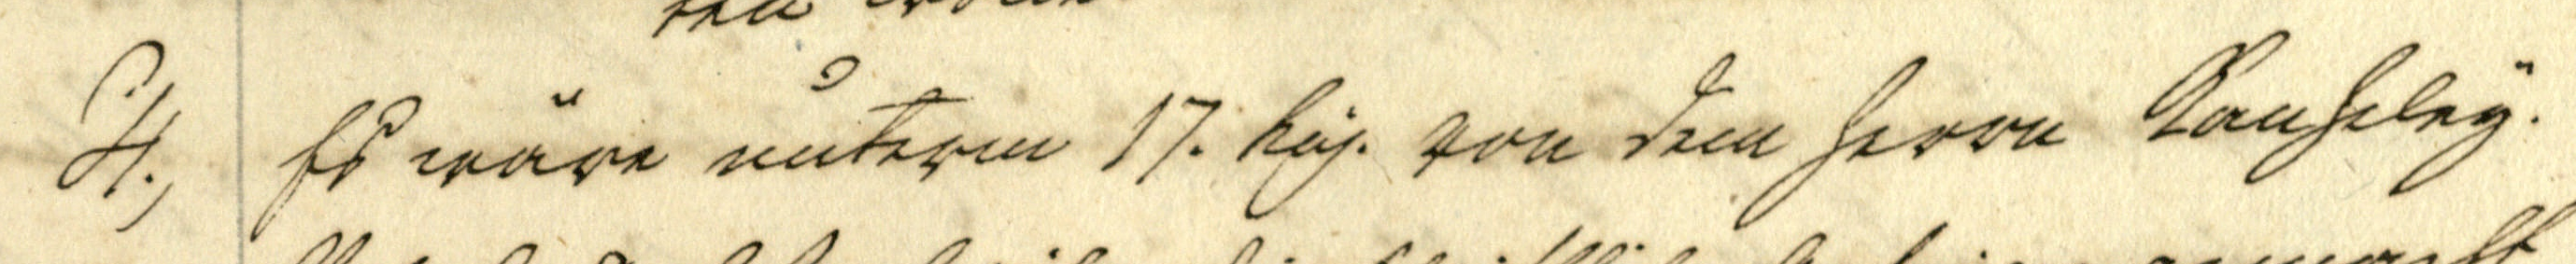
4. Es wäre unterm 17. huj. von dem Herrn Kanzeleÿ¬
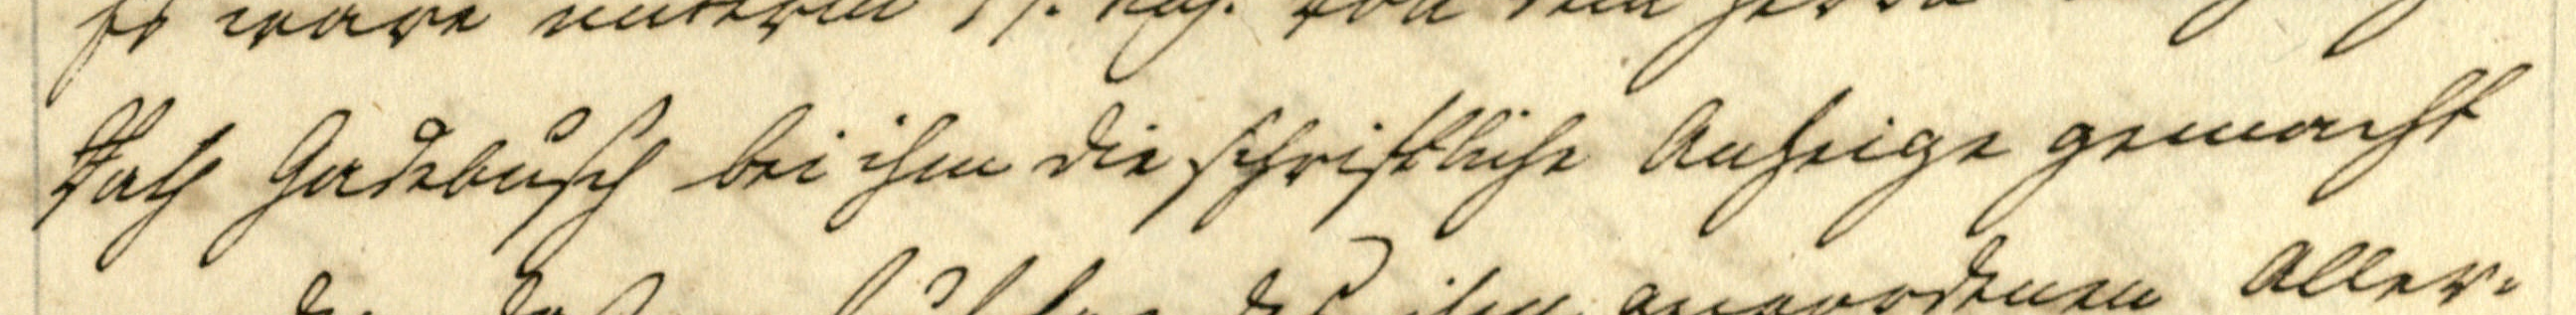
Rath Gadebusch bei ihm die schriftliche Anzeige gemacht
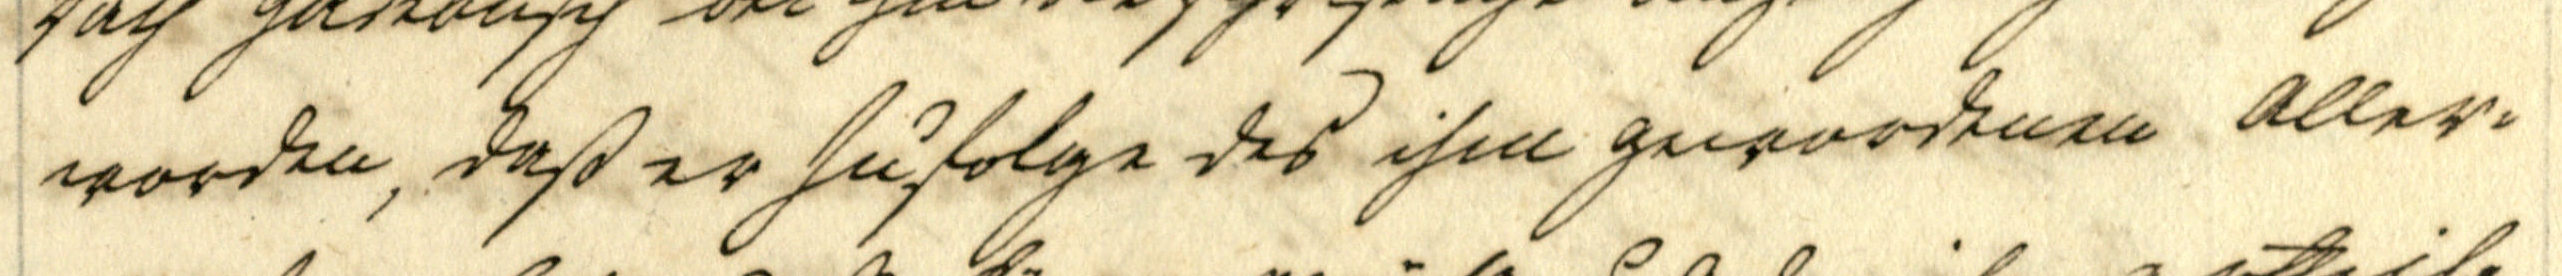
worden, daß er zufolge des ihm gewordenen aller¬
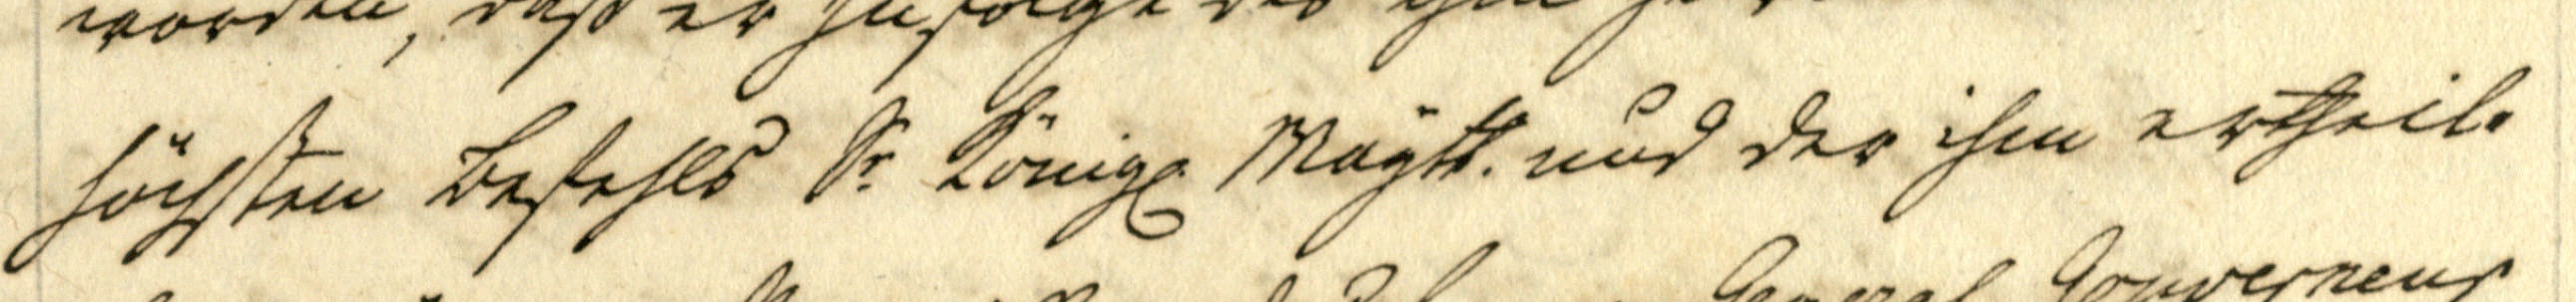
höchsten Befehls Sr Königl. Maÿtt. und der ihm ertheil¬
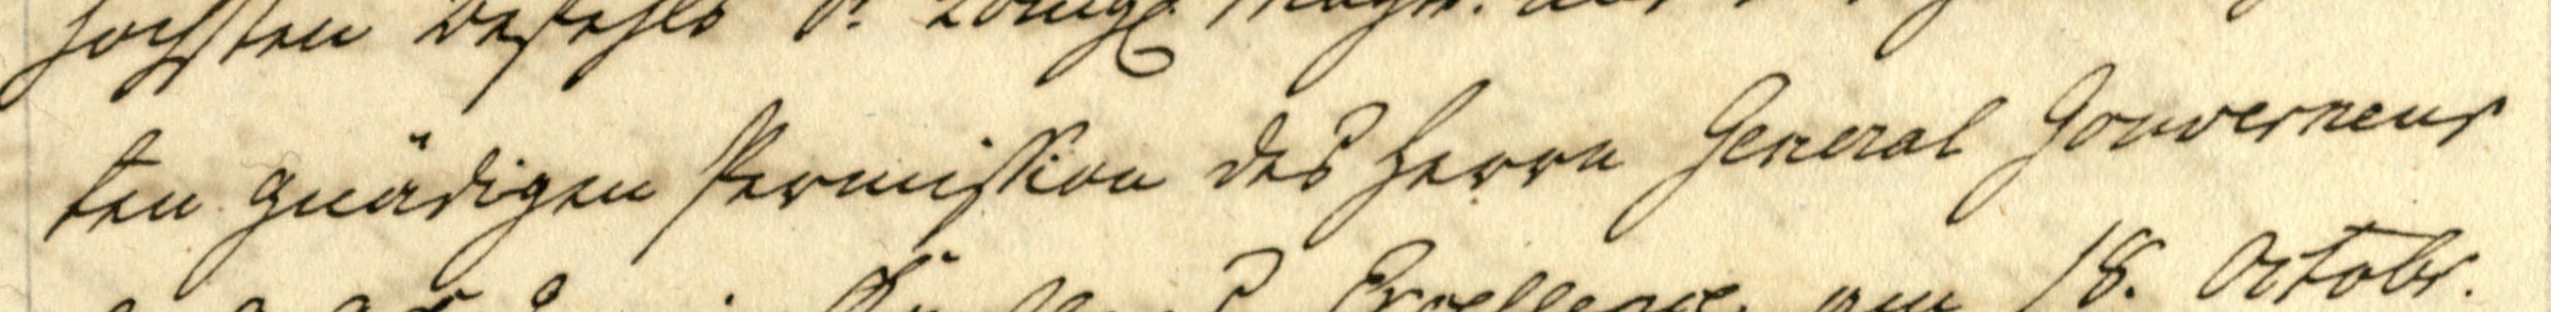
ten gnädigen Permisson des Herrn General Gouverneur
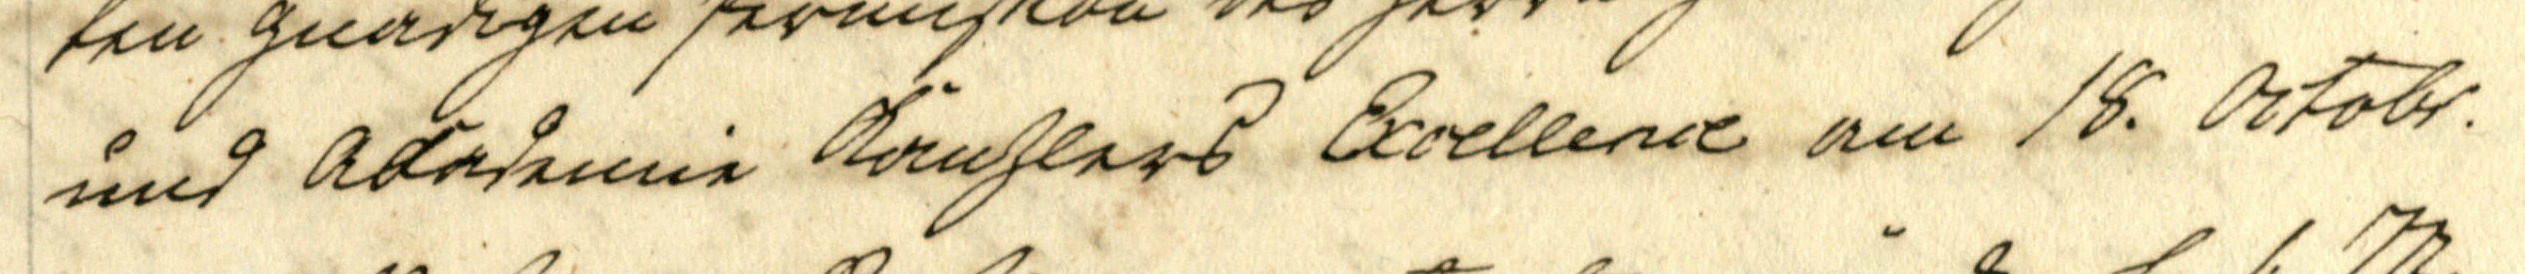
und Akademie Kanzlers Excellence am 18. Octobr.
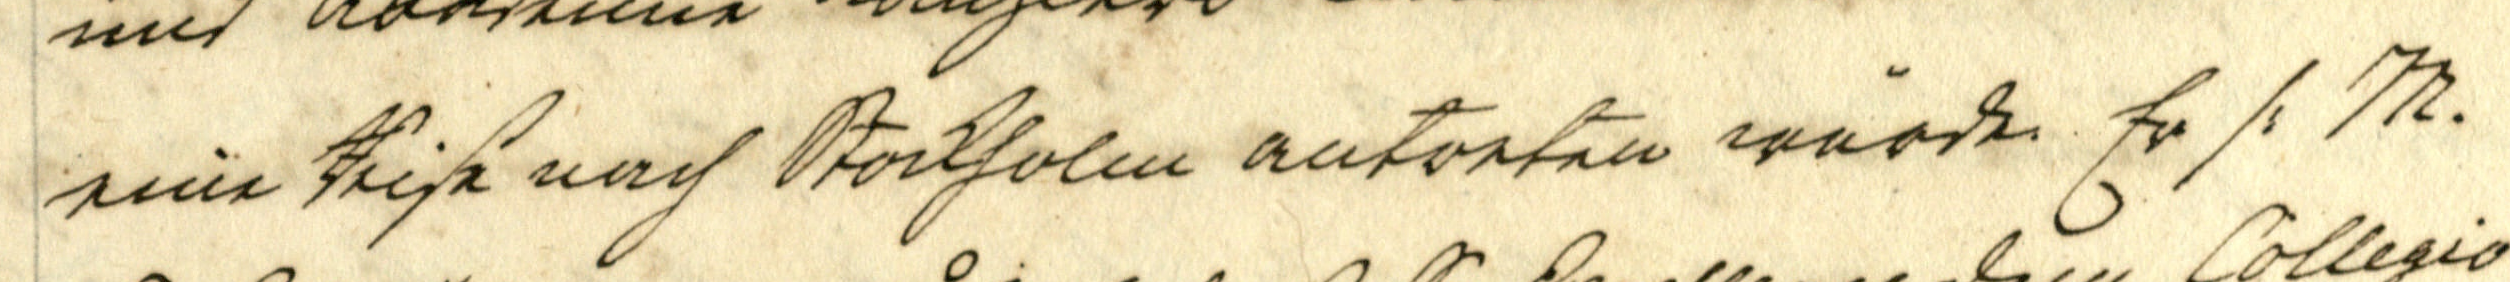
eine Reise nach Stockholm antreten würde. Er /. M.
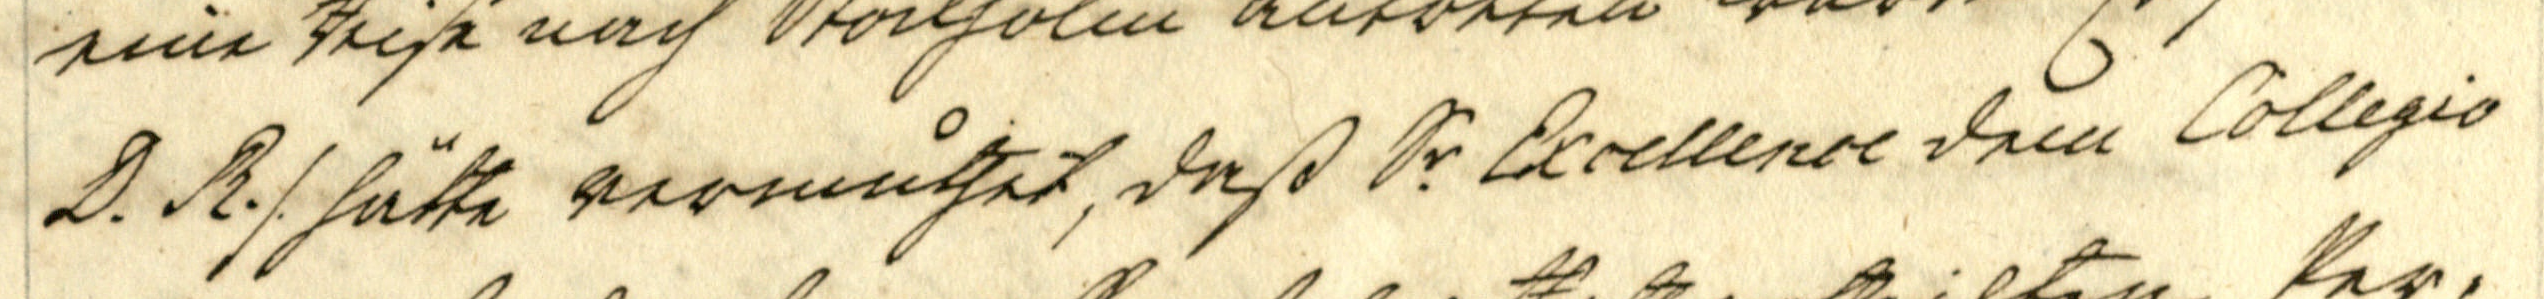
D. R./ hätte vermuthet, daß Sr Excellence dem Collegio
